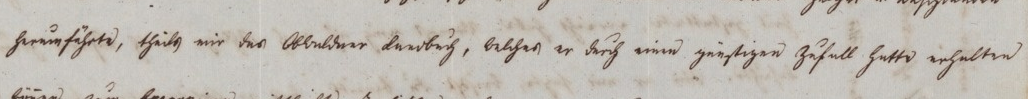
herumführte, theils mir das Obwaldner Landbuch, welches er durch einen günstigen Zufall hatte erhalten
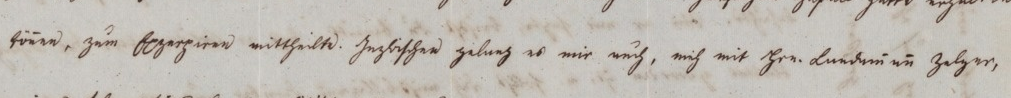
können, zum Exzerpiren mittheilte. Inzwischen gelang es mir auch, mich mit Hrn. Landammann Zelger,
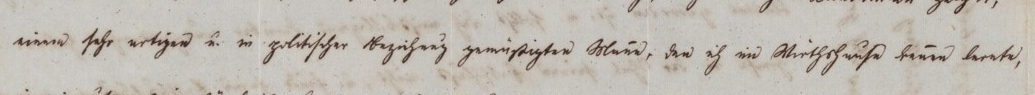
einem sehr artigen u. in politischer Beziehung gemäßigten Manne, den ich im Wirthshause kennen lernte,
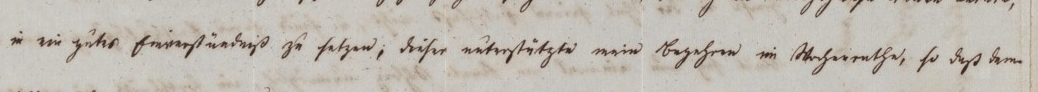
in ein gutes Einverständniß zu setzen, dieser unterstützte mein Begehren im Wochenrathe, so daß dem-
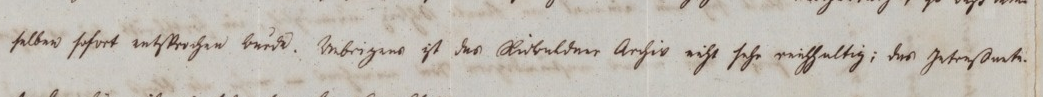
selben sofort entsprochen wurde. Uebrigens ist das Nidwaldner Archiv nicht sehr reichhaltig; das Intressante-
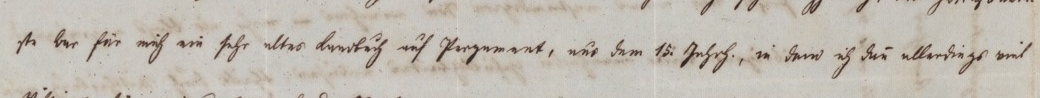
ste war für mich ein sehr altes Landbuch auf Pergament, aus dem 15. Jahrh., in dem ich dann allerdings viel
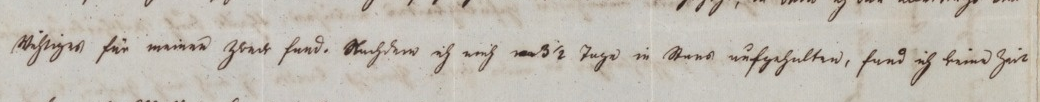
Wichtiges für meinen Zweck fand. Nachdem ich mich 3 ½ Tage in Stans aufgehalten, fand ich keine Zeit
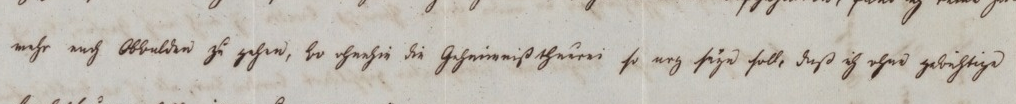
mehr nach Obwalden zu gehen, wo ohnehin die Geheimnißthuerei so arg seyn soll, daß ich ohne gewichtige
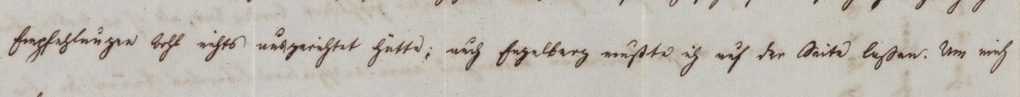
Empfehlungen wohl nichts ausgerichtet hätte; auch Engelberg mußte ich auf der Seite lassen. Um mich
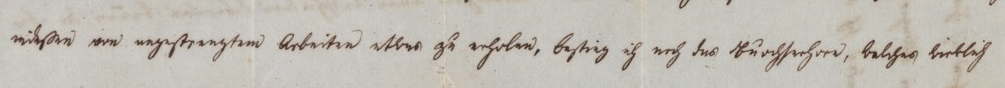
indessen von angestrengtem Arbeiten etwas zu erholen, bestieg ich noch das Buochserhorn, welches wirklich
